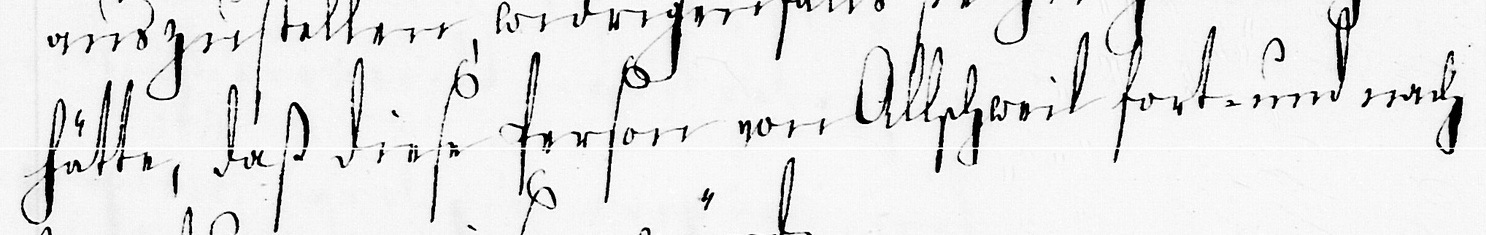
hätte, daß diese Person von Allschweil fort- und
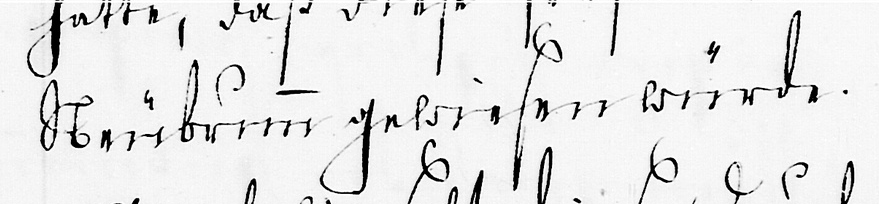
Neubrunn gewiesen würde.
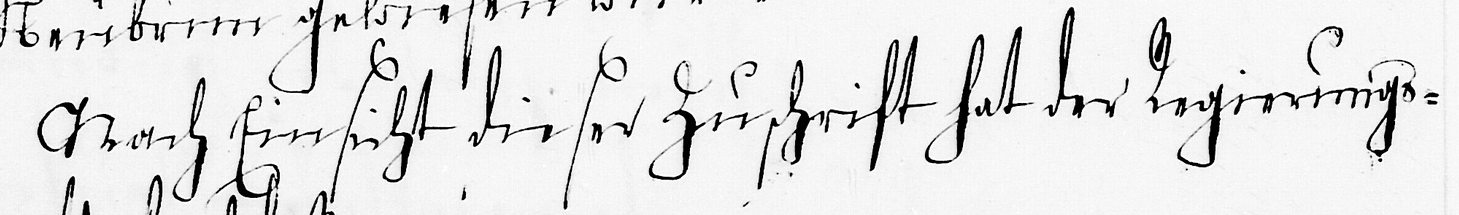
Nach Einsicht dieser Zuschrift hat der Regierungs¬
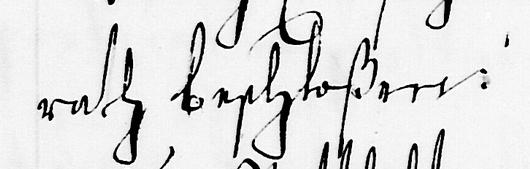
rath beschloßen:
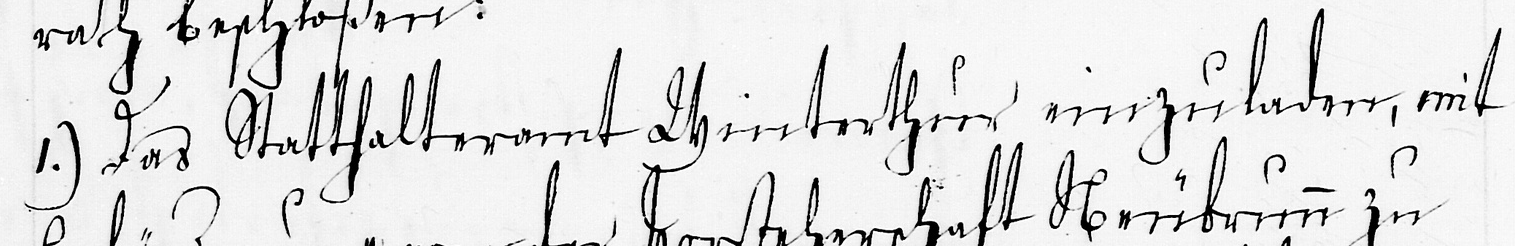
1.) Das Statthalteramt Winterthur einzuladen, mit
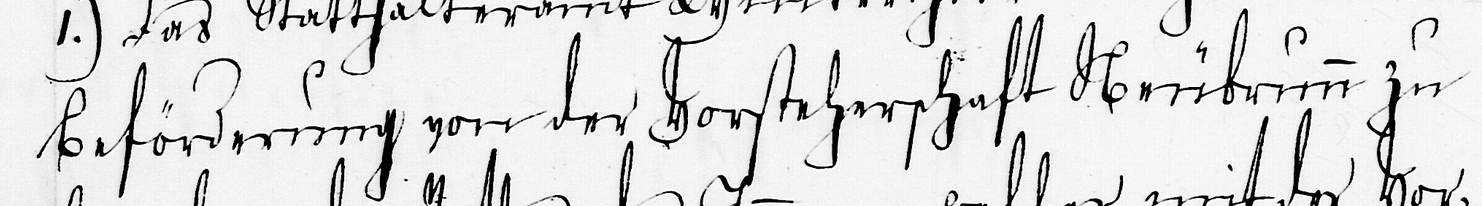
Beförderung von der Vorsteherschaft Neubrunn zu
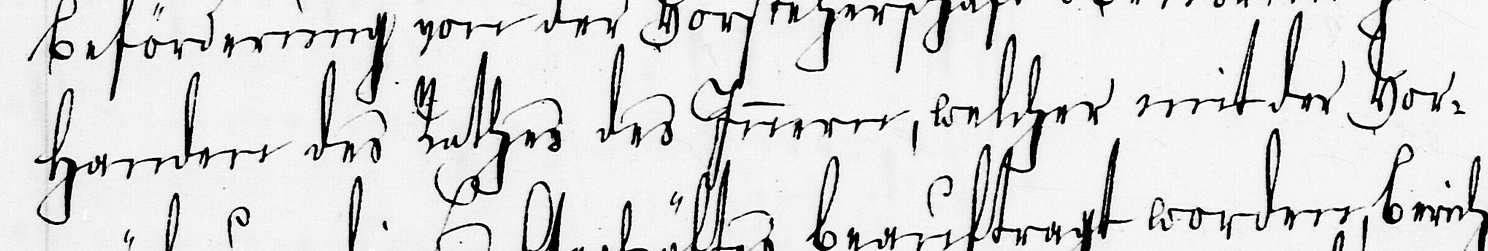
Handen des Rathes des Innern, welcher mit der Vor¬
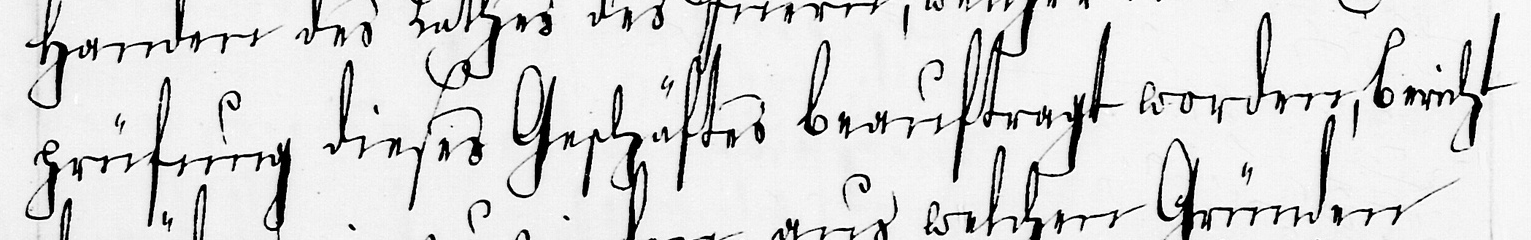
prüfung dieses Geschäftes beauftragt worden, Beric¬
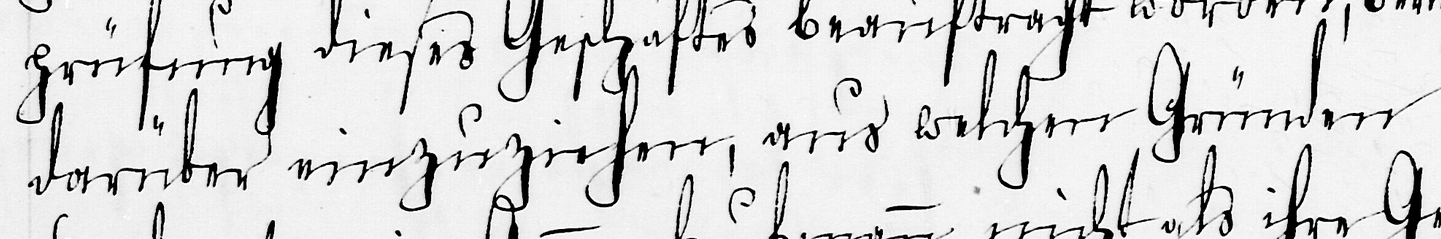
darüber einzuziehen, aus welchen Gründen
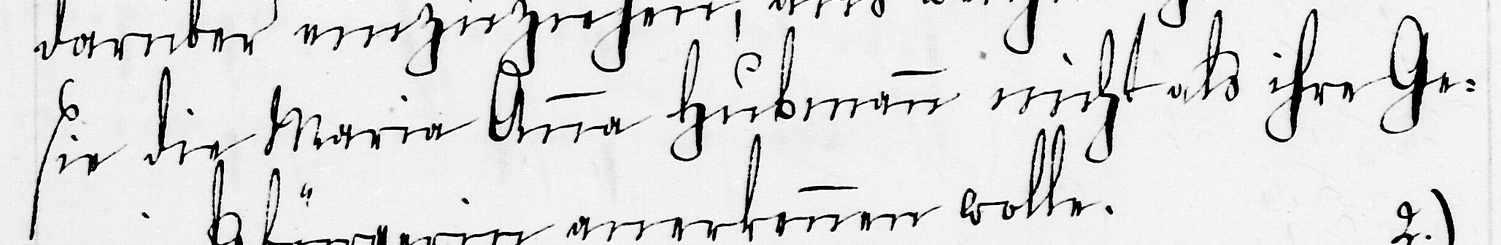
sie die Maria Anna Hubmann nicht als ihre Ge¬
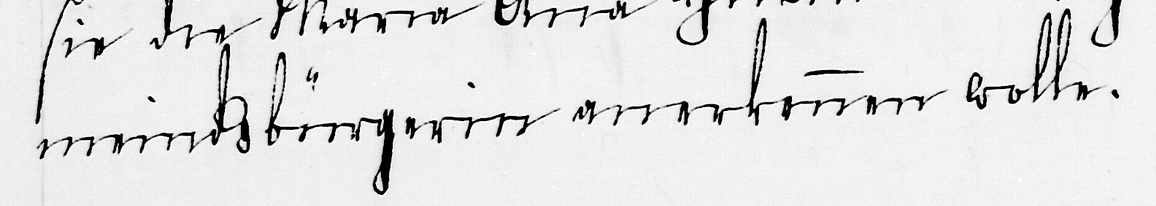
meindsbürgerin anerkennen wolle.
